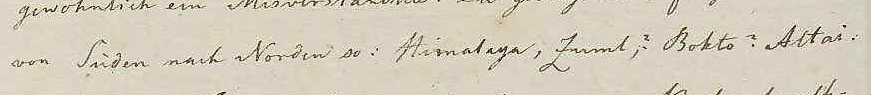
von Süden nach Norden so: Himalaya, Zuml, ? Bokto ? Altai:
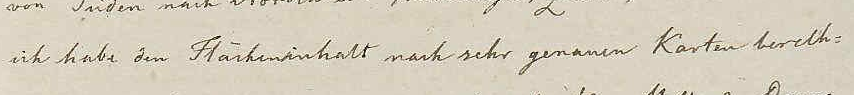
ich habe den Flächeninhalt nach sehr genauen Karten berech-
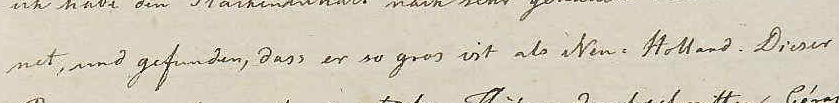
net, und gefunden, dass er so gros ist als Neu-Holland. Dieser
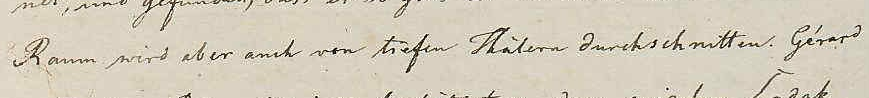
Raum wird aber auch von tiefen Thälern durchschnitten. Gérard
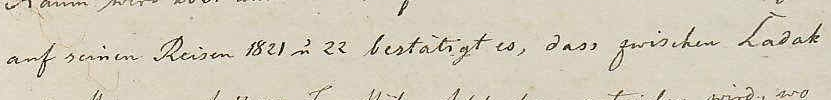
auf seinen Reisen 1821 u 22 bestätigt es, dass zwischen Ladak
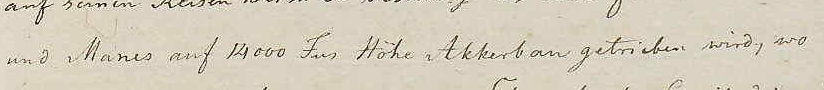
und Manes auf 14000 Fus Höhe Akkerbau getrieben wird, wo
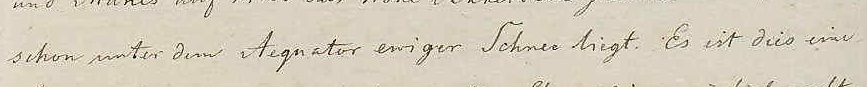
schon unter dem Aequator ewiger Schnee liegt. Es ist dies eine
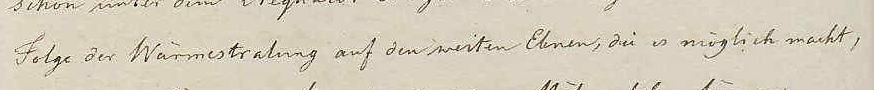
Folge der Wärmestralung auf den weiten Ebnen, die es möglich macht,
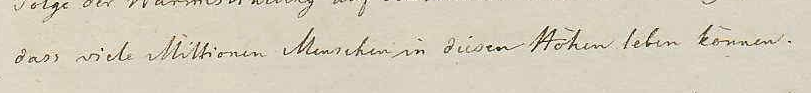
dass viele Millionen Menschen in diesen Höhen leben können.
